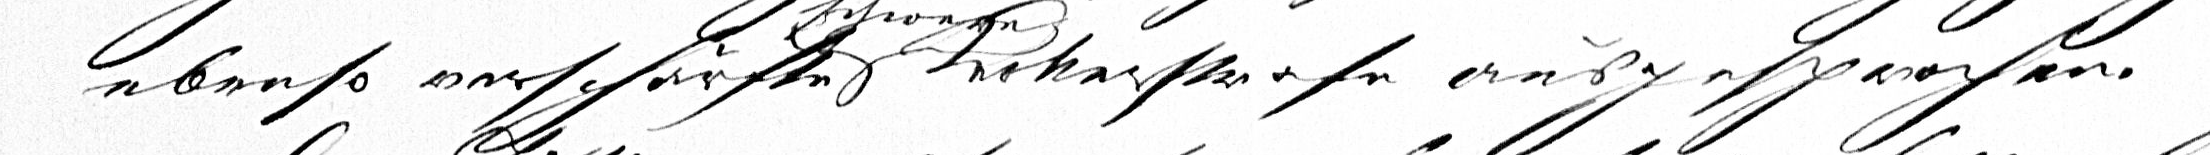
ebenso verschärfte Kerkerstrafe ausgesprochen.
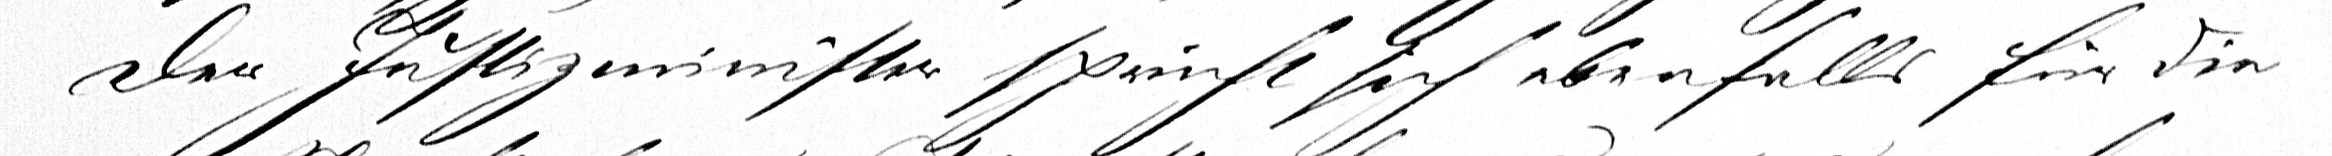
Der Justizminister spricht sich ebenfalls für die
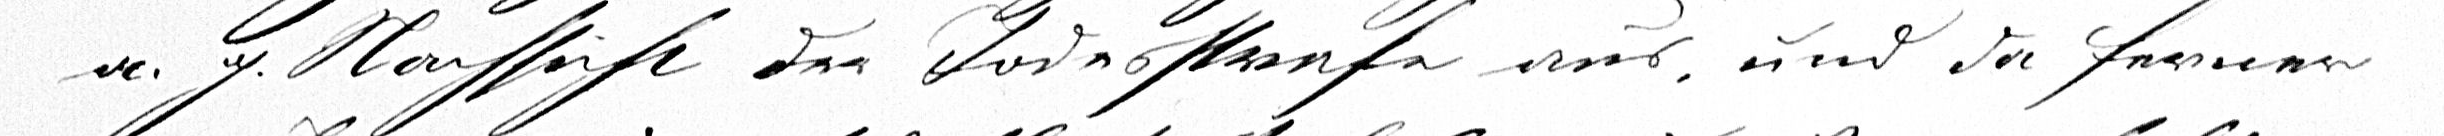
a. g. Nachsicht der Todesstrafe aus, und da ferner
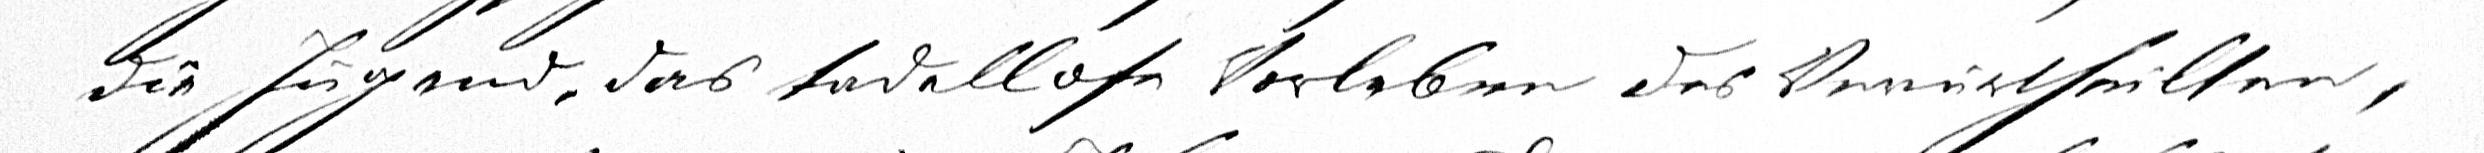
die Jugend, das tadellose Vorleben des Verurtheilten,
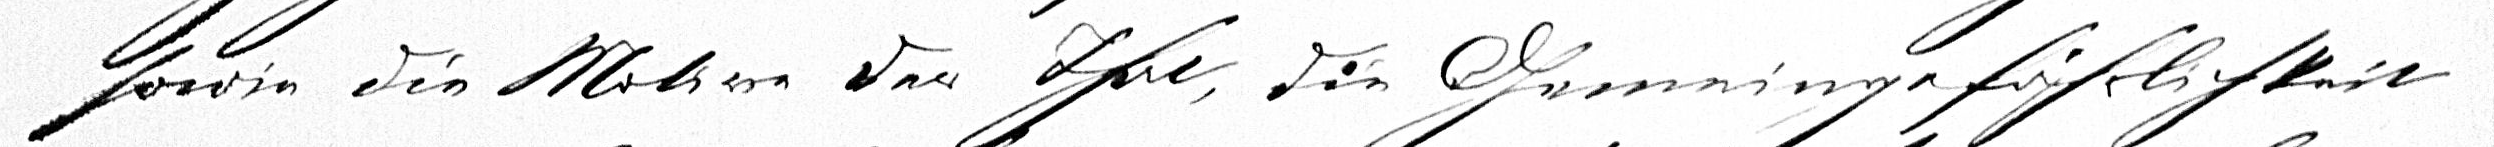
sowie die Motive der That, die Gemeingefährlichkeit
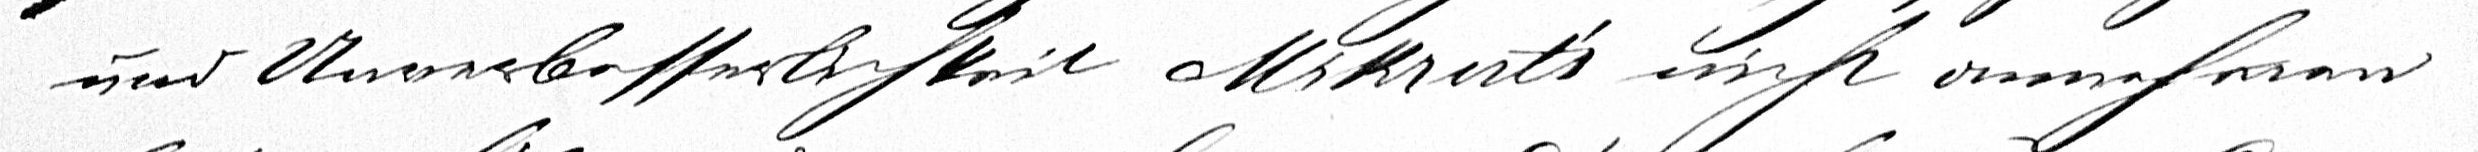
und Unverbesserlichkeit Mikrut's nicht annehmen
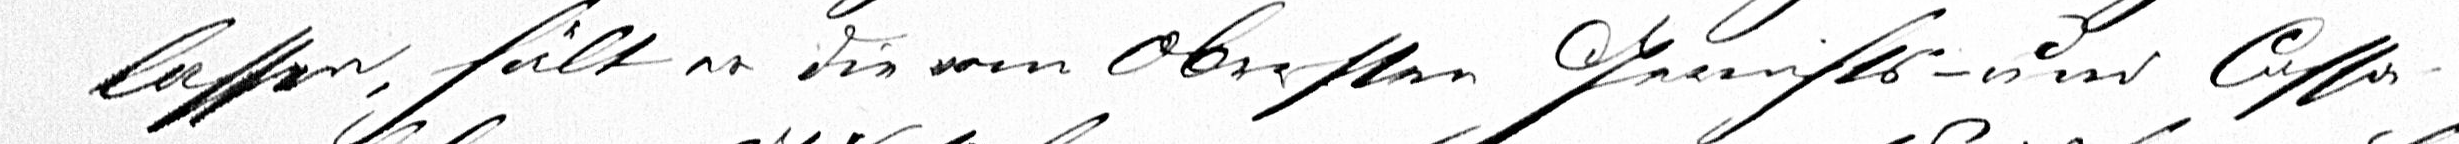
lassen, hält er die xx Obersten Gerichts- und Cassa¬
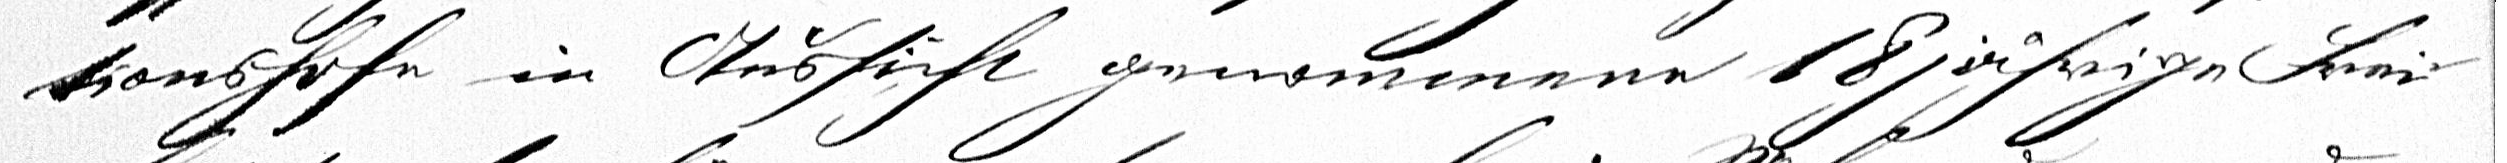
tionshofe in Aussicht genommene 18jährige Frei¬
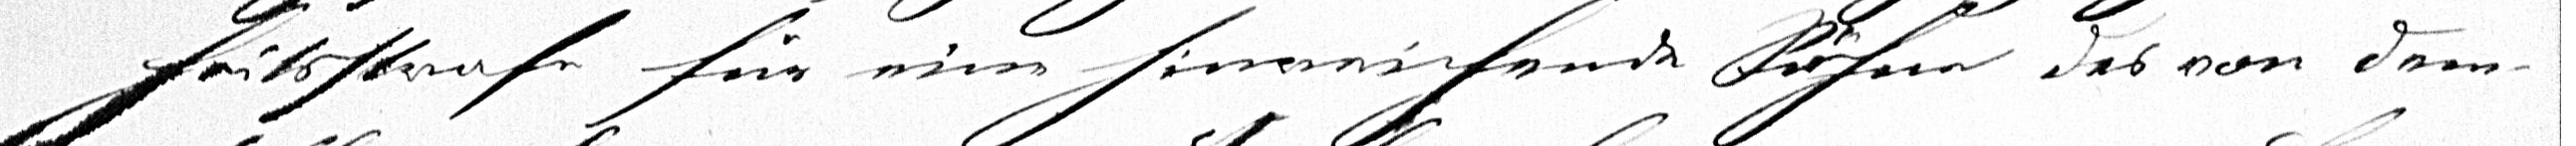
heitsstrafe für eine hinreichende Söhne des von dem¬
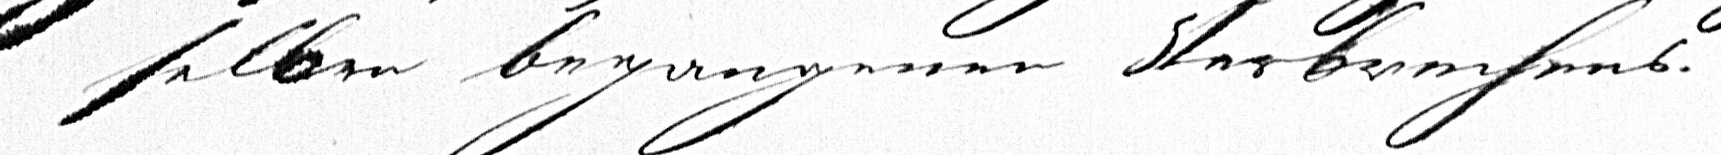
selben begangener Verbrechens.
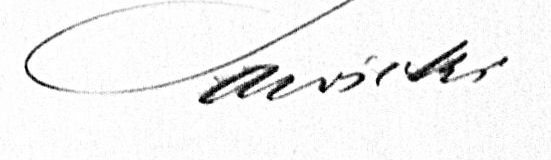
Sawicki
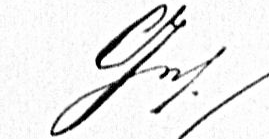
Ges.
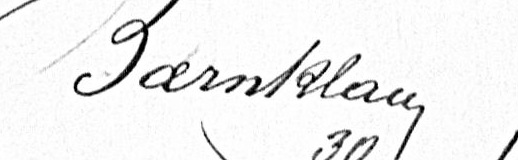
Barnklau
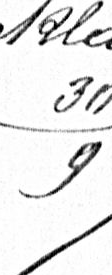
30/9
